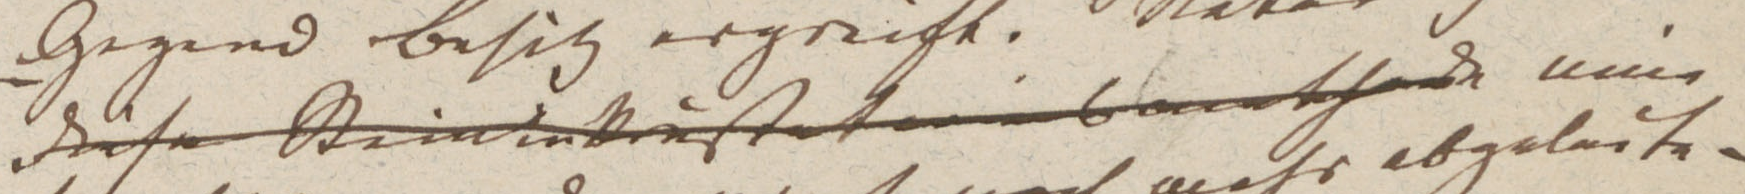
diese Steininkrustationsmethode eine
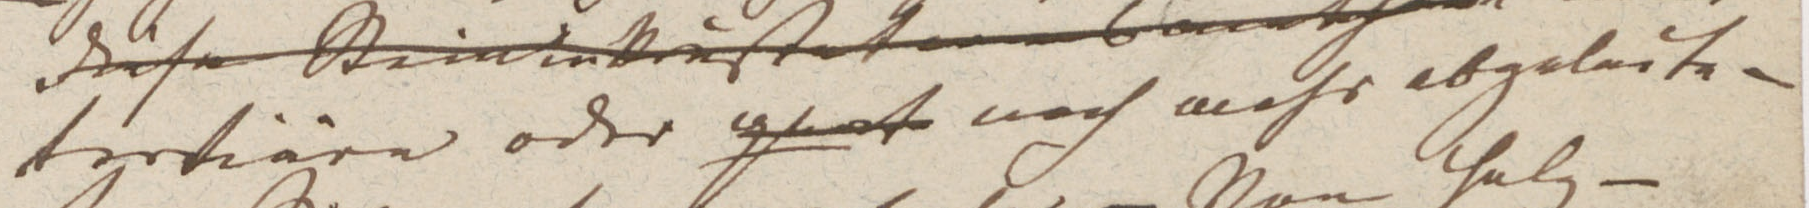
tertiäre oder noch mehr abgeleite-
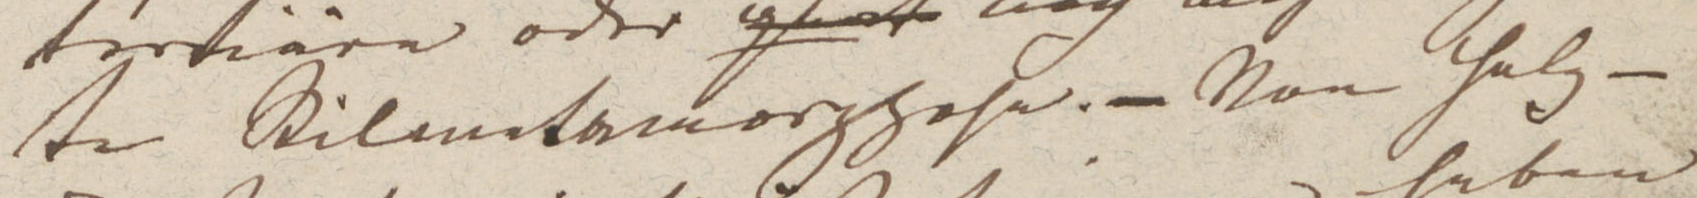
te Stilmetamorphose. – Von Holz-
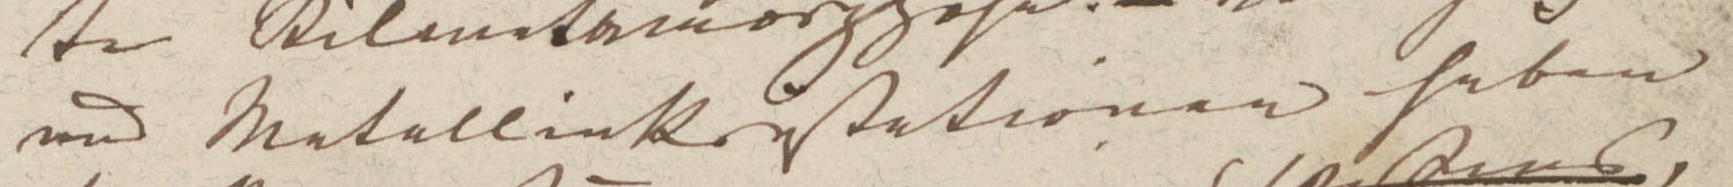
und Metallinkrustationen haben
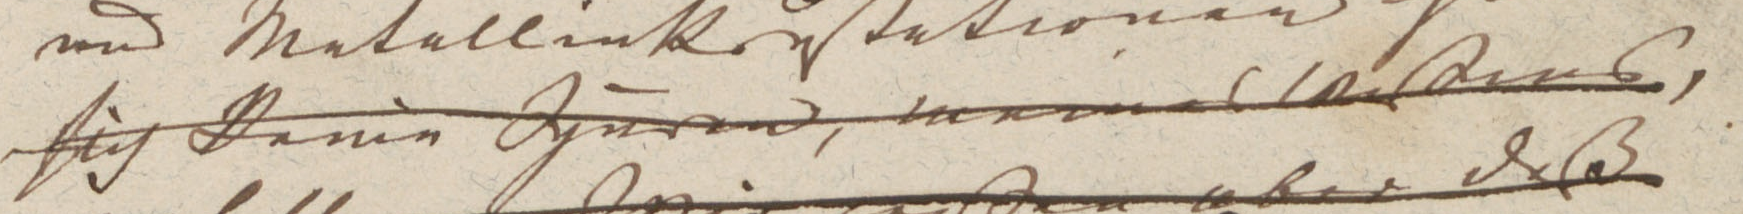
sich keine Spuren, meines Wissens,
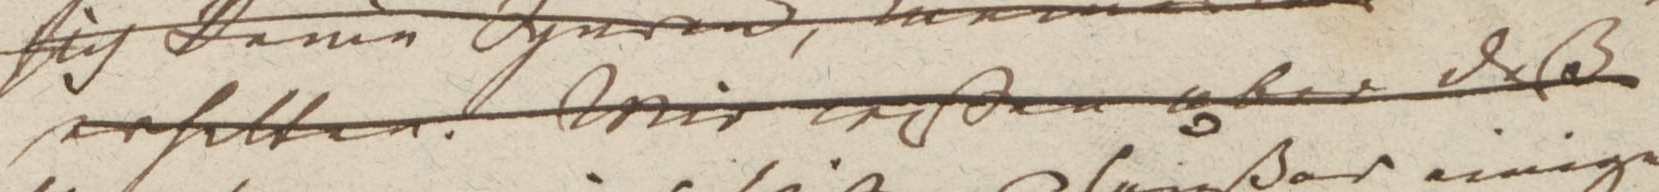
erhalten. Wir wissen aber dass
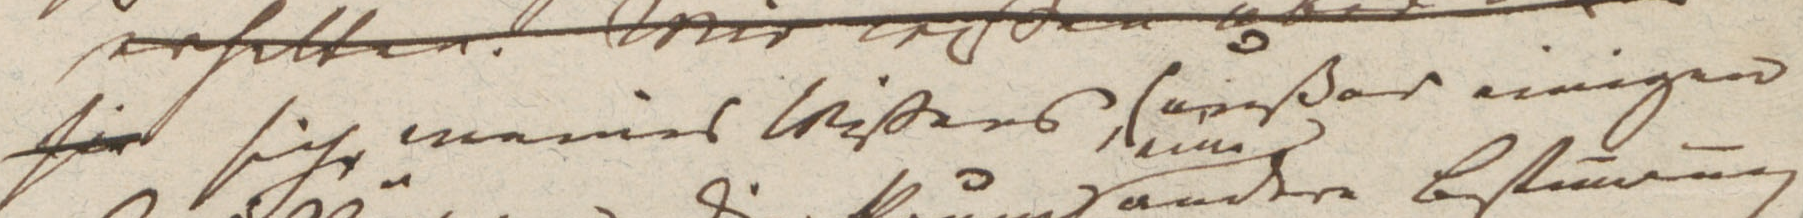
sie sich meines Wissens, (ausser einigen
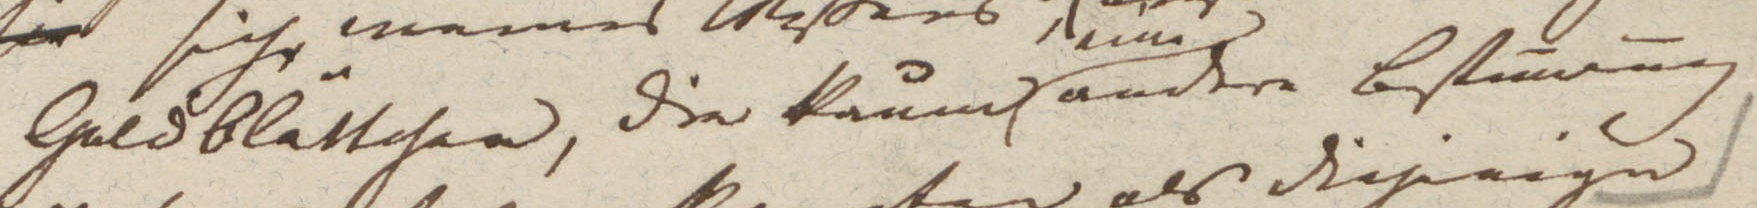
Goldblättchen, die kaum eine andere Bestimmung
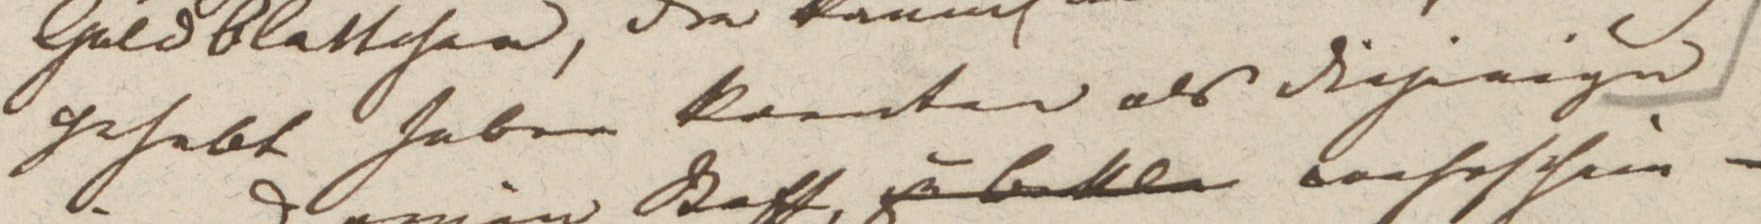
gehabt haben konnten als diejenige %
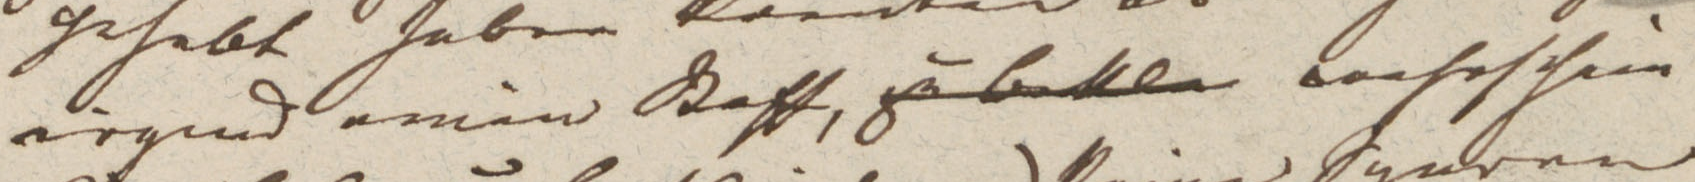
irgend einen Stoff, zu bekle wahrschein-
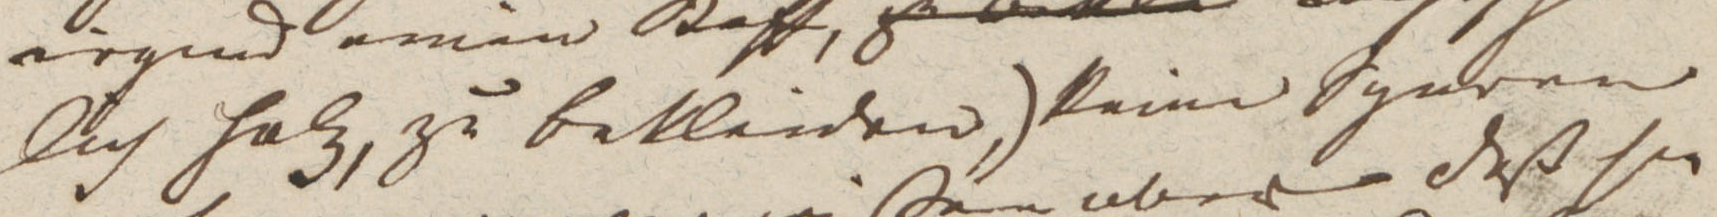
lich Holz, zu bekleiden,) keine Spuren
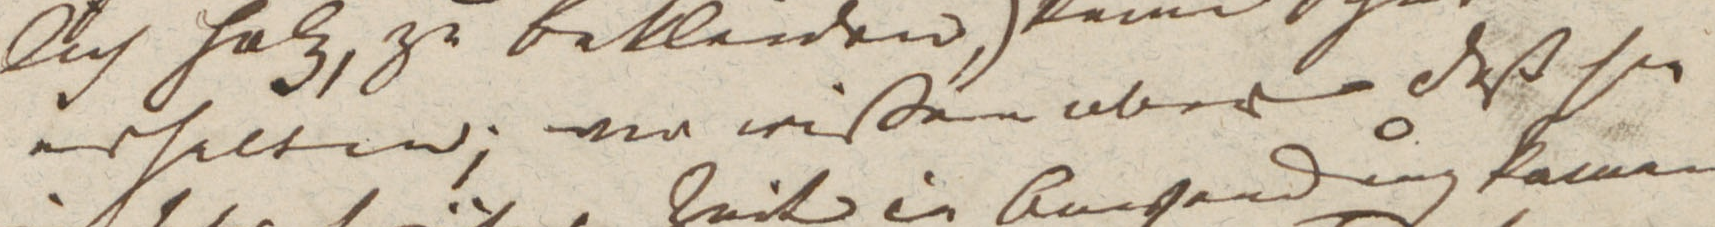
erhalten; wir wissen aber dass sie
